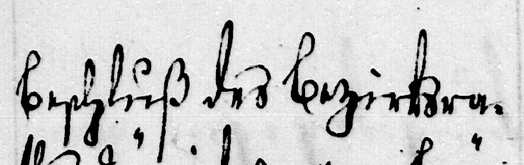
Beschluß des Bezirksra¬
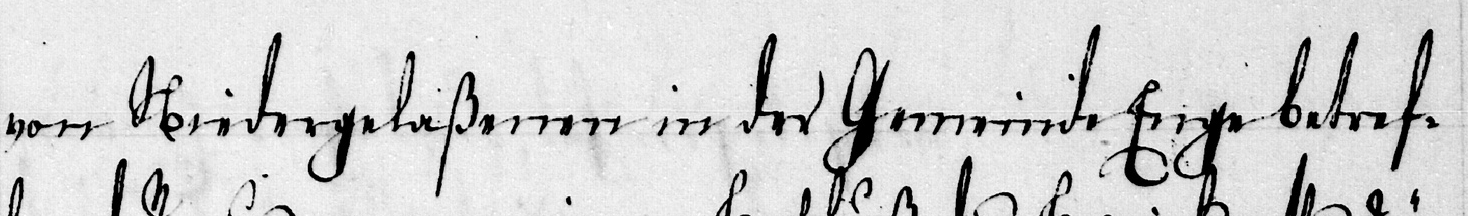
von Niedergelaßenen in der Gemeinde Enge betref¬
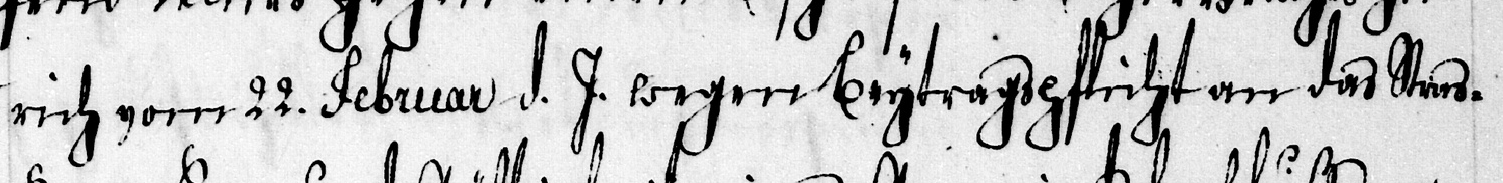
rich vom 22. Februar d. J. wegen Beytragspflicht an das Stra¬
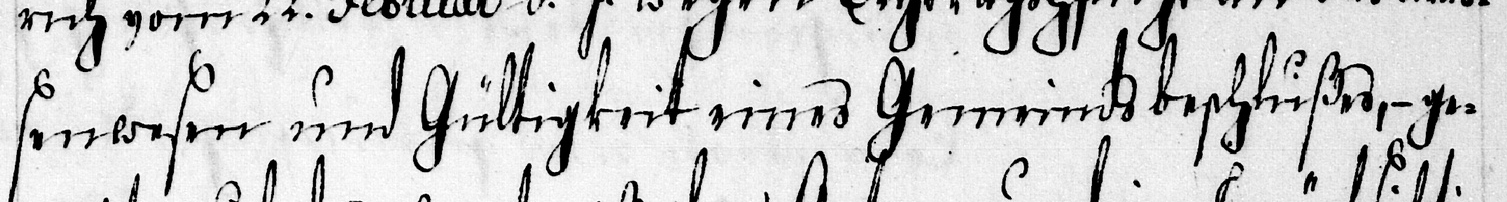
ßenwesen und Gültigkeit eines Gemeindsbeschlußes, – ge¬
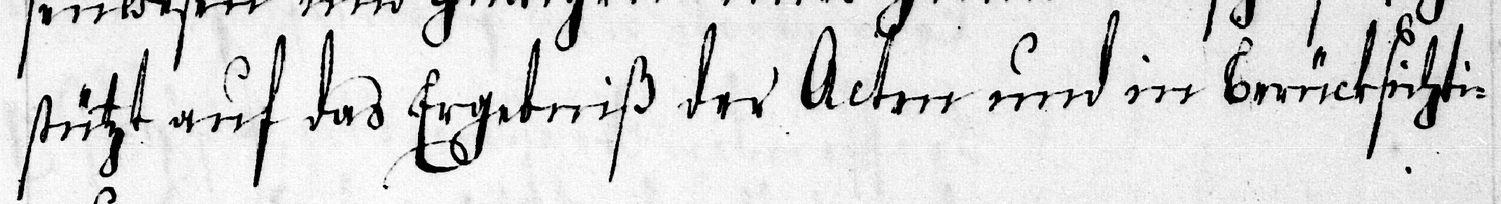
stützt auf das Ergebniß der Acten und in Berücksichti¬
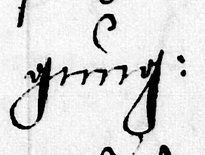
gung:
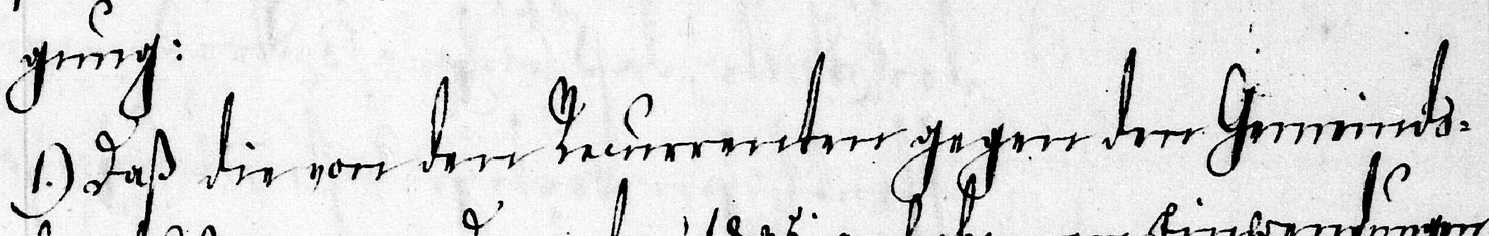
1.) Daß die von den Recurrenten gegen den Gemeinds¬
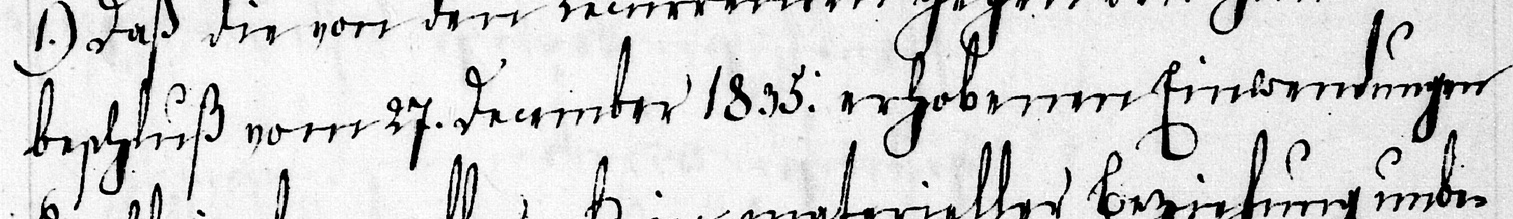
beschluß vom 27. December 1835. erhobenen Einwendungen
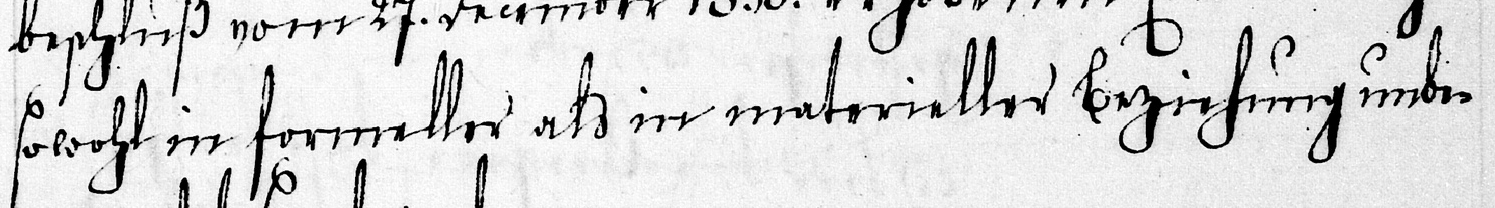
sowohl in formeller als in materieller Beziehung unbe¬
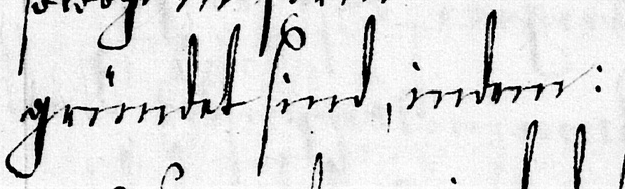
gründet sind, indem:
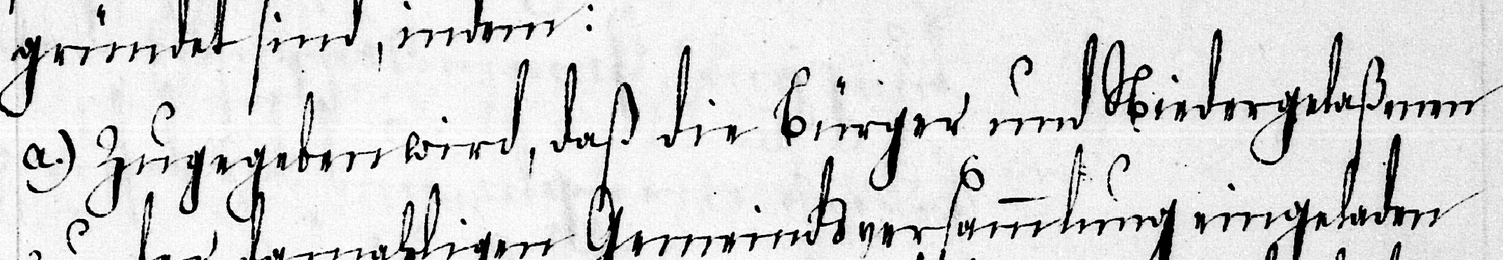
a.) Zugegeben wird, daß die Bürger und Niedergelaßenen
